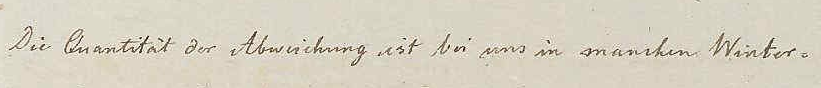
Die Quantität der Abweichung ist bei uns in manchen Winter-
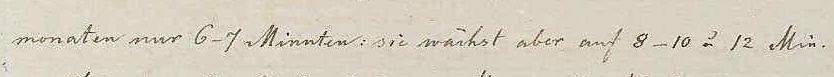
monaten nur 6–7 Minuten: sie wächst aber auf 8–10 u 12 Min.
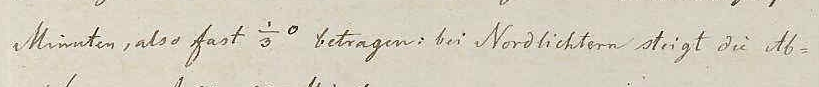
Minuten, also fast ⅓° betragen: bei Nordlichtern steigt die Ab-
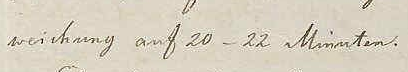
weichung auf 20–22 Minuten.
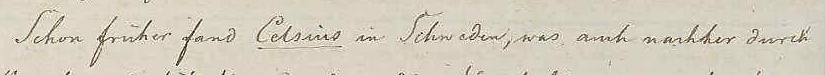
Schon früher fand Celsius in Schweden, was auch nachher durch
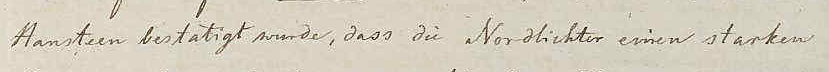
Hansteen bestätigt wurde, dass die Nordlichter einen starken
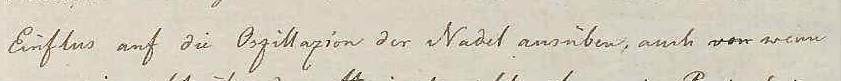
Einflus auf die Oszillazion der Nadel ausüben, auch vonwenn
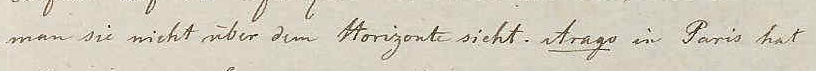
man sie nicht über dem Horizonte sieht. Arago in Paris hat
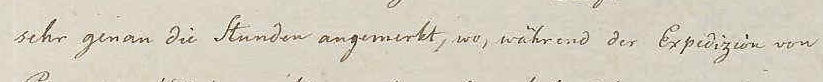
sehr genau die Stunden angemerkt, wo, während der Expedizion von
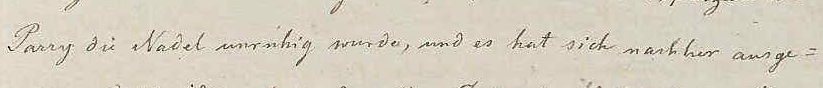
Parry die Nadel unruhig wurde, und es hat sich nachher ausge-
